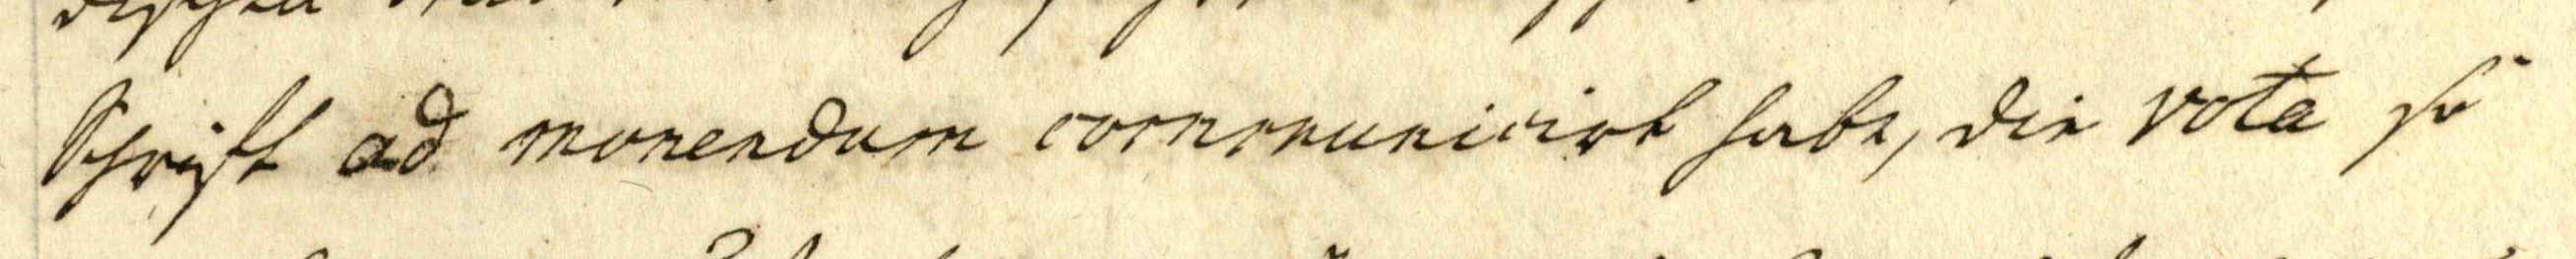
Schrift ad monendum communicirt habe, die vota so
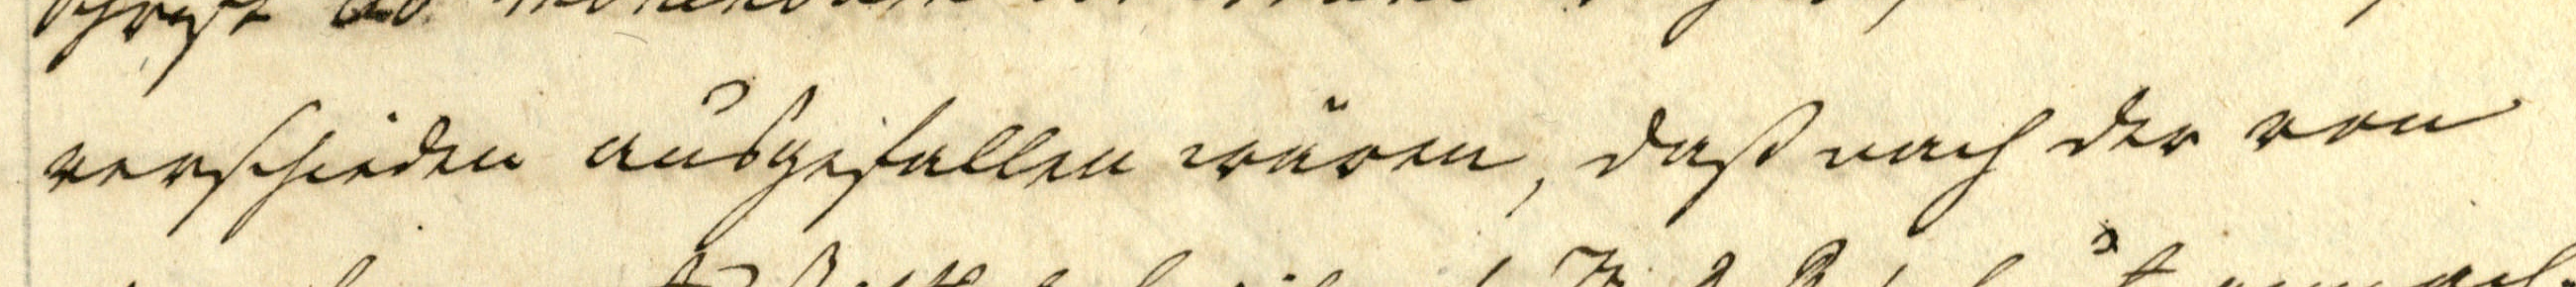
verschieden ausgefallen wären, daß nach der von
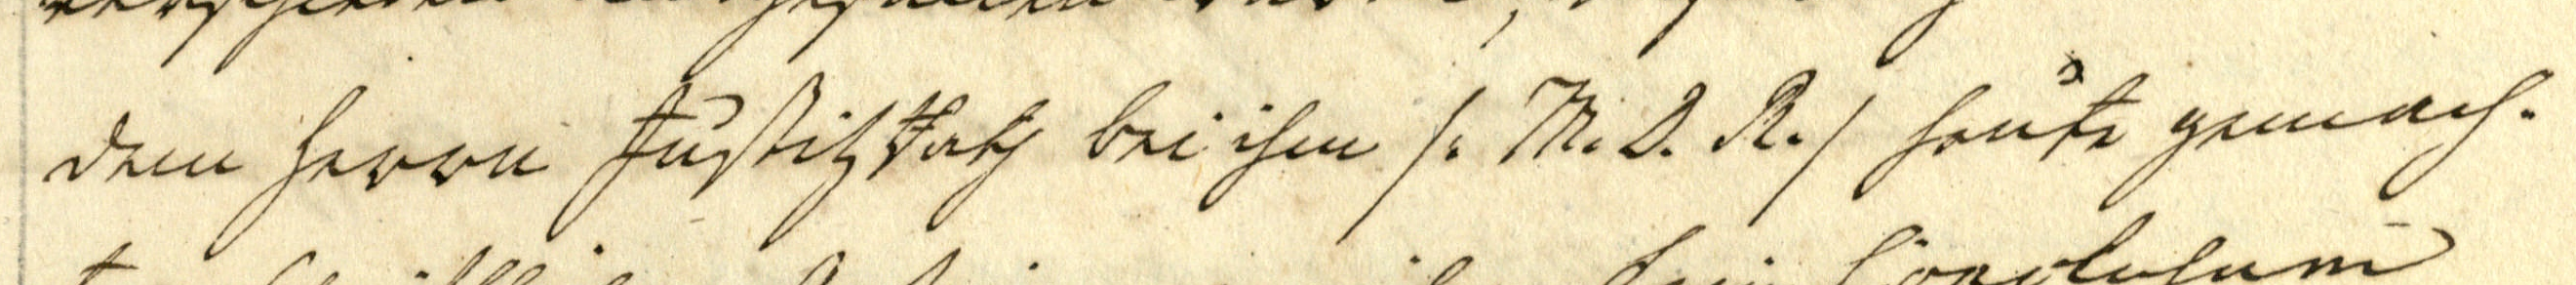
dem Herrn Justitz Rath bei ihm /: M. D. R./ heute gemach¬
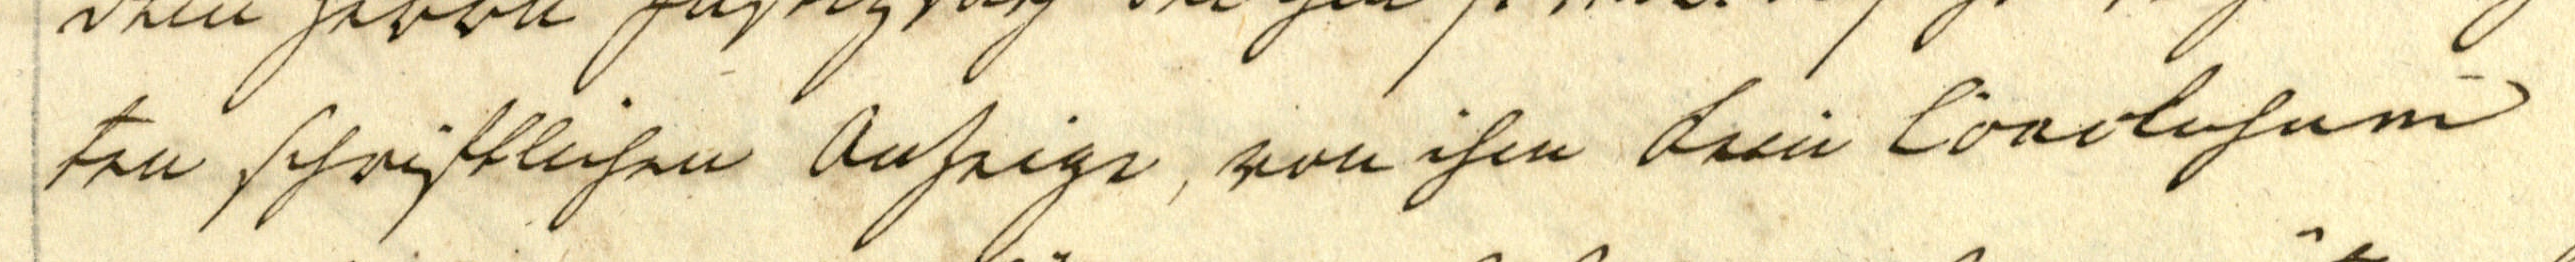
ten schriftlichen Anzeige, von ihm kein Conclusum
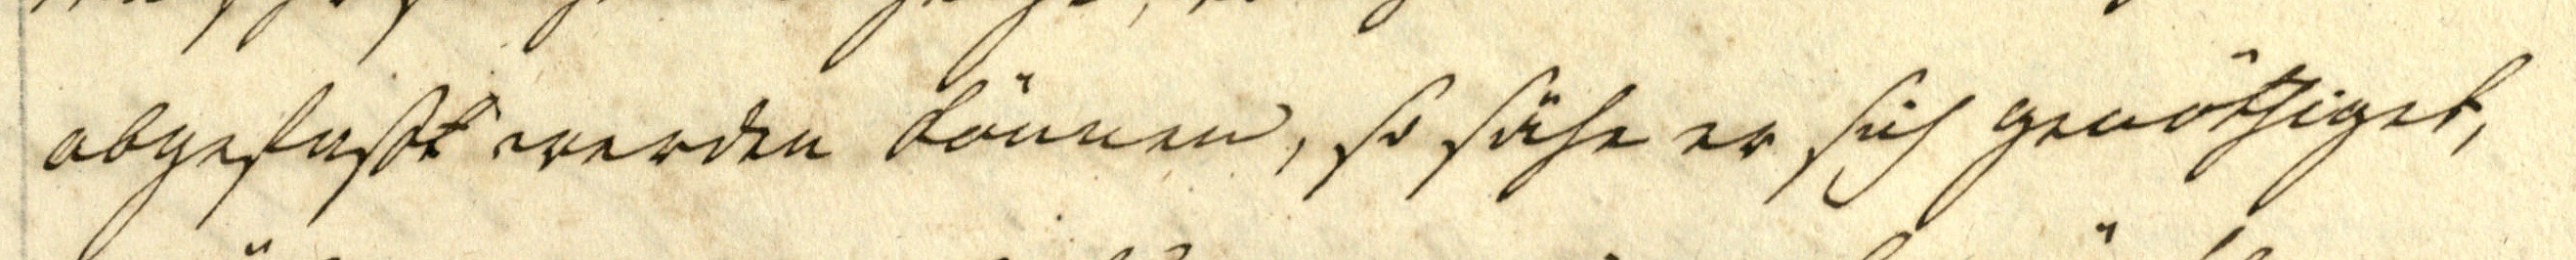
abgefaßt werden können, so sähe er sich genöthiget,
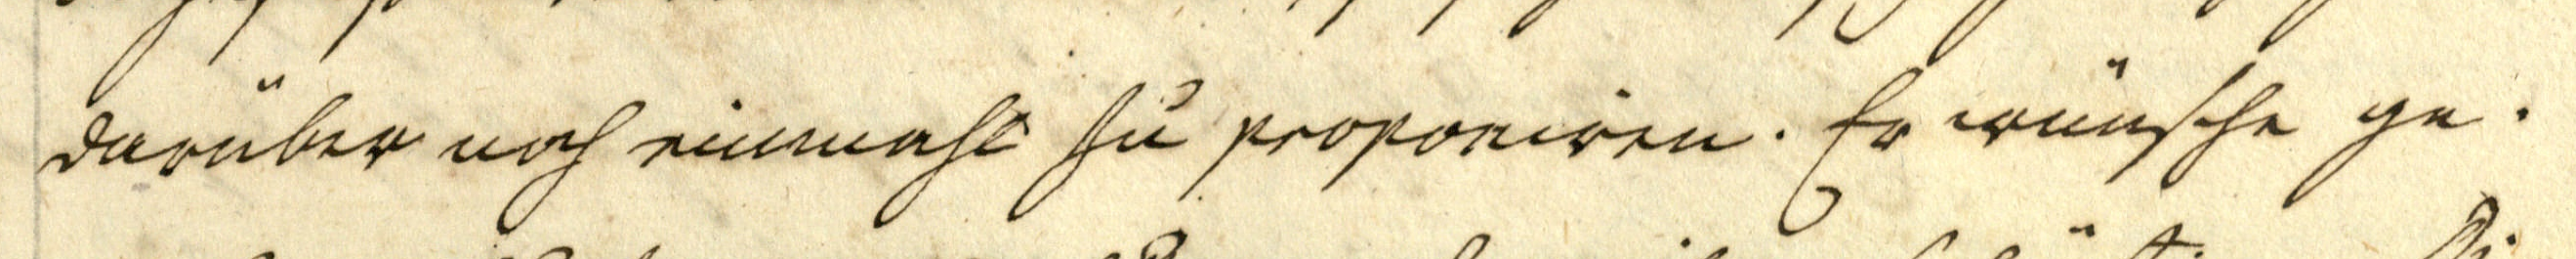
darüber noch einmahl zu proponiren. Er wünsche ge¬
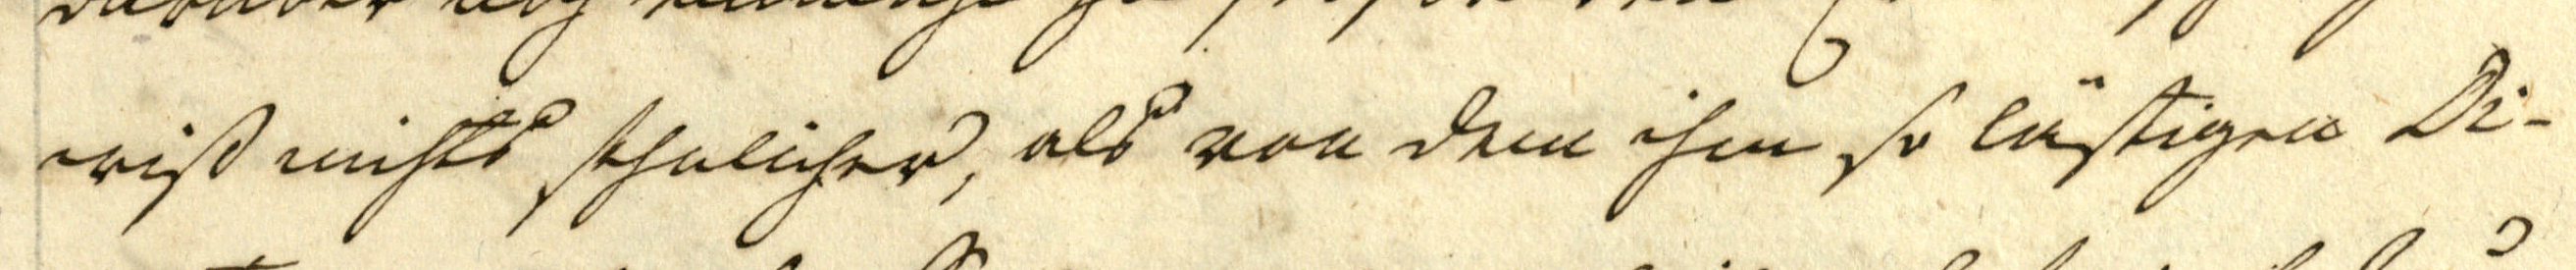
wiß nichts sehnlicher, als von dem ihm so lästigen Di¬
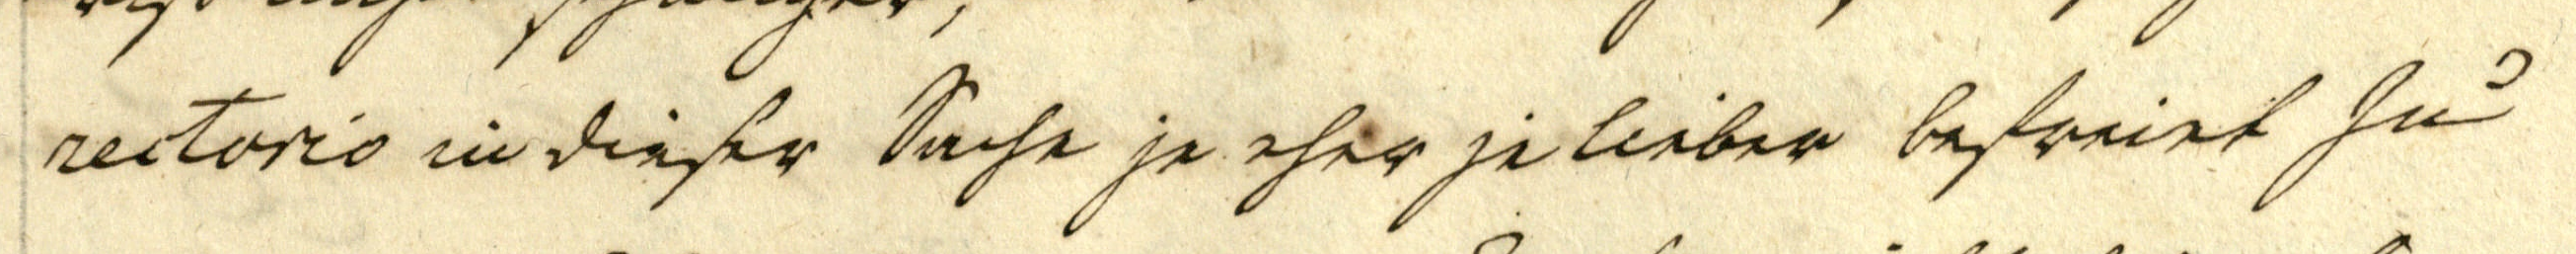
rectorio in dieser Sache je eher je lieber befreiet zu
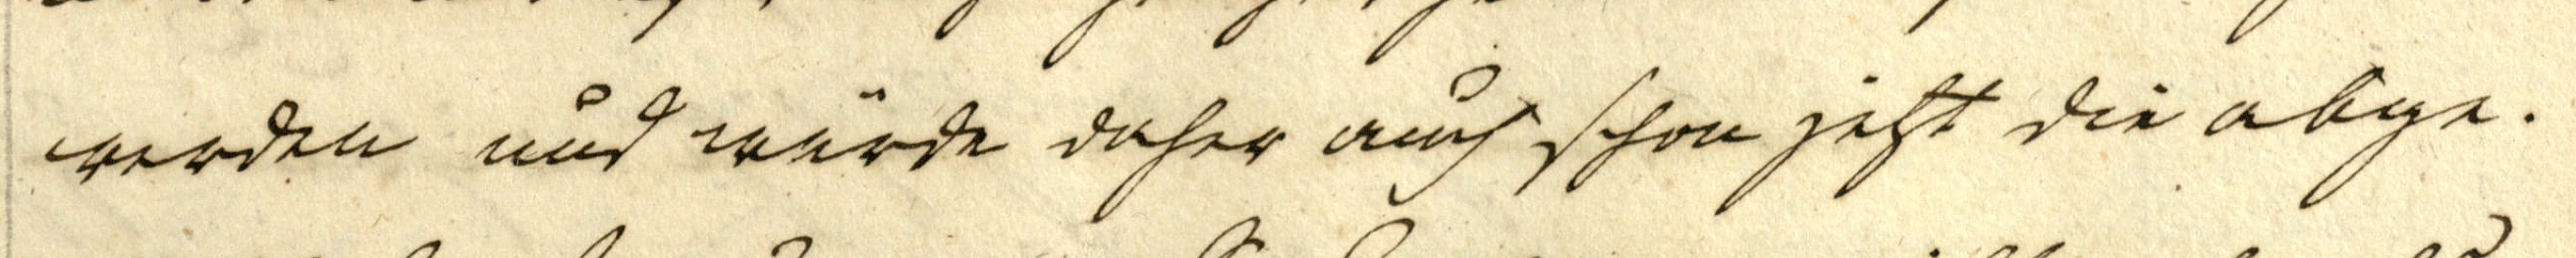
werden und würde daher auch schon jetzt die abge¬
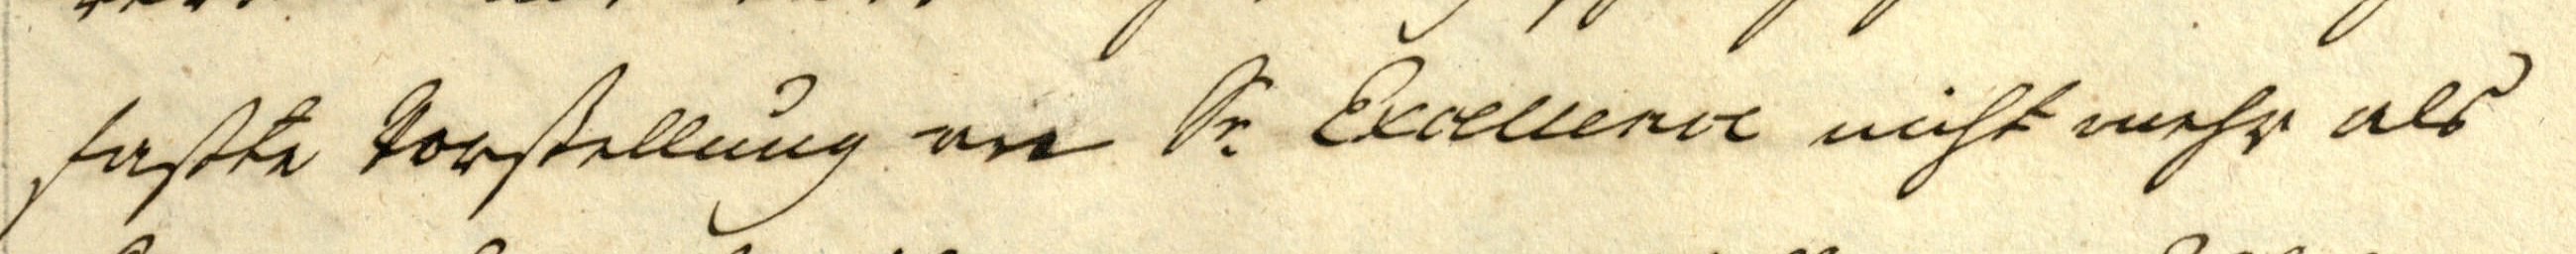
faßte Vorstellung an Sr. Excellence nicht mehr als
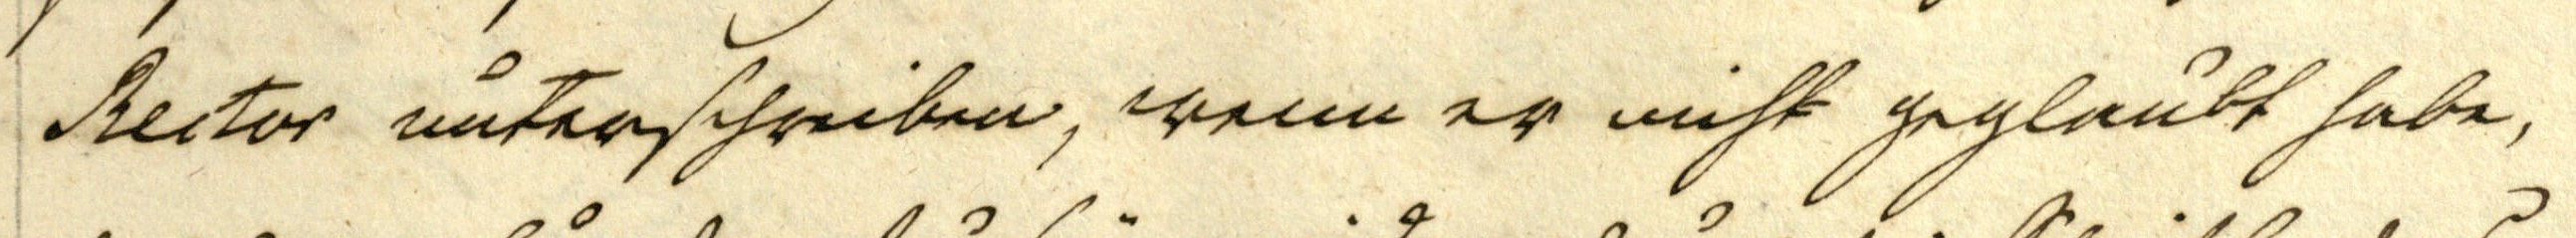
Rector unterschreiben, wenn er nicht geglaubt habe,
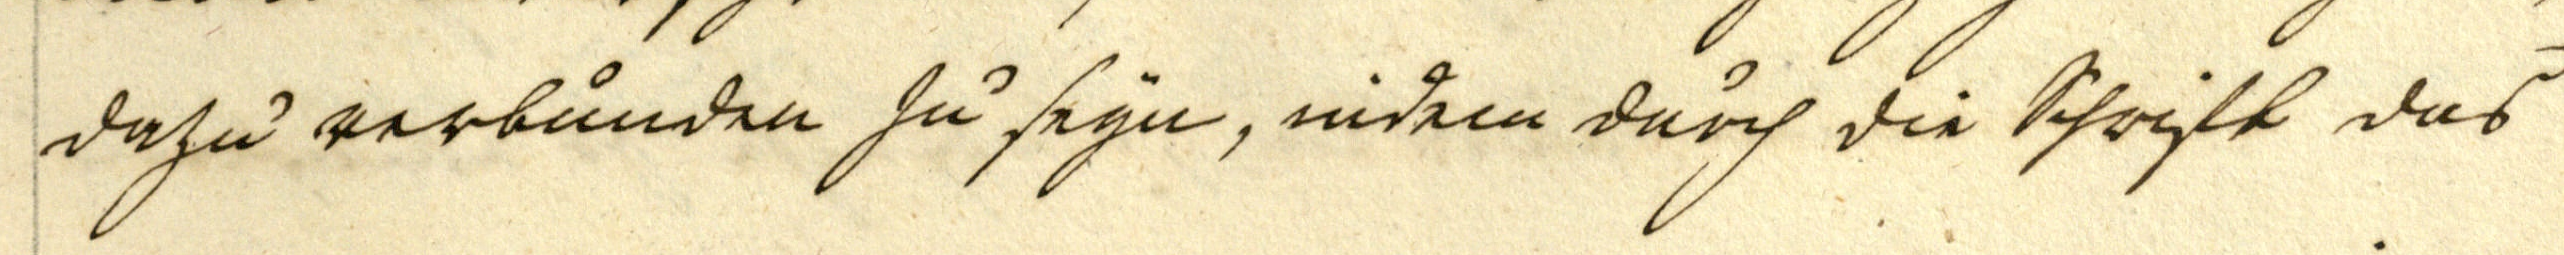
dazu verbunden zu seÿn, indem durch die Schrift das
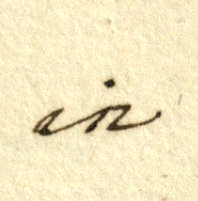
in
